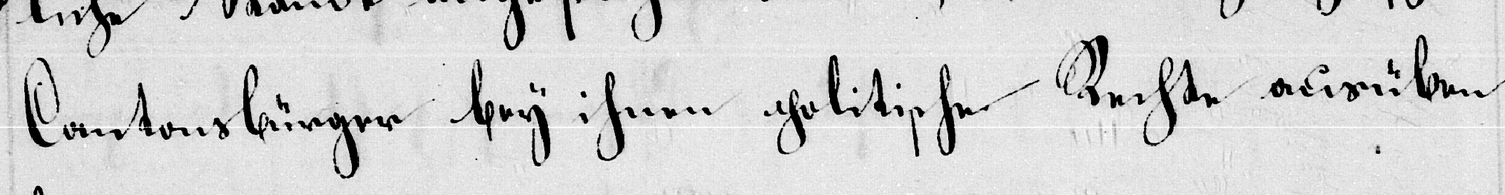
Cantonsbürger bey ihnen politische Rechte ausüben
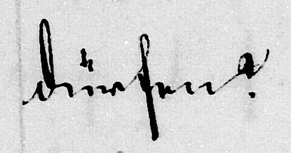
dürfen?
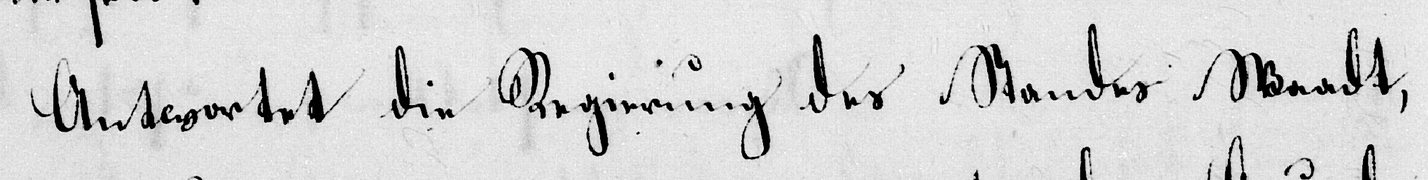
Antwortet die Regierung des Standes Waadt,
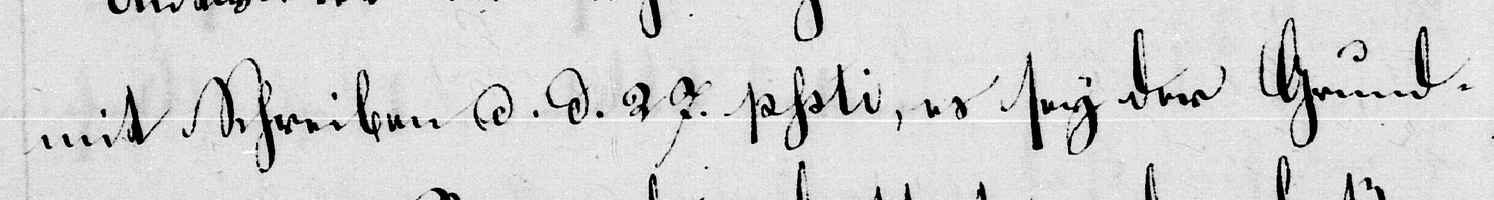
mit Schreiben d. d. 27. pssti, es sey der Grund¬
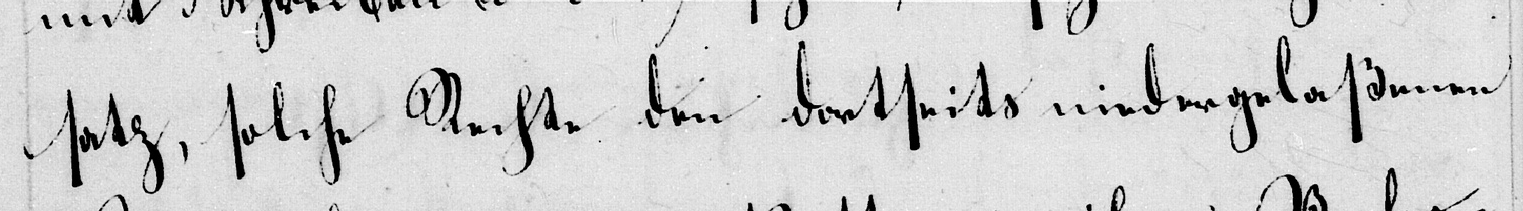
satz, solche Rechte den dortseits niedergelaßenen
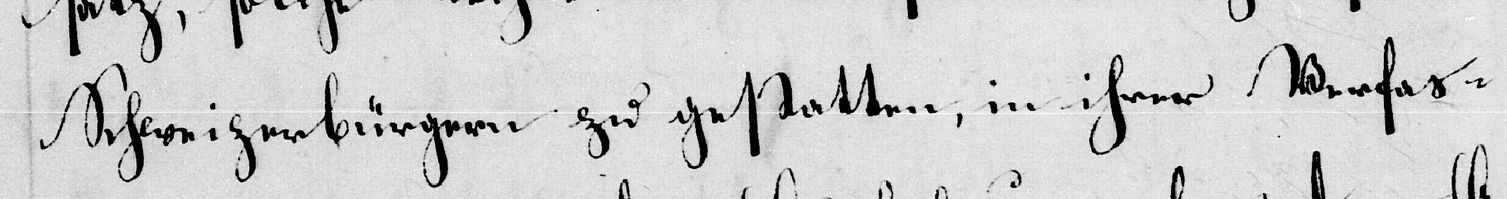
Schweizerbürgern zu gestatten, in ihrer Verfa¬
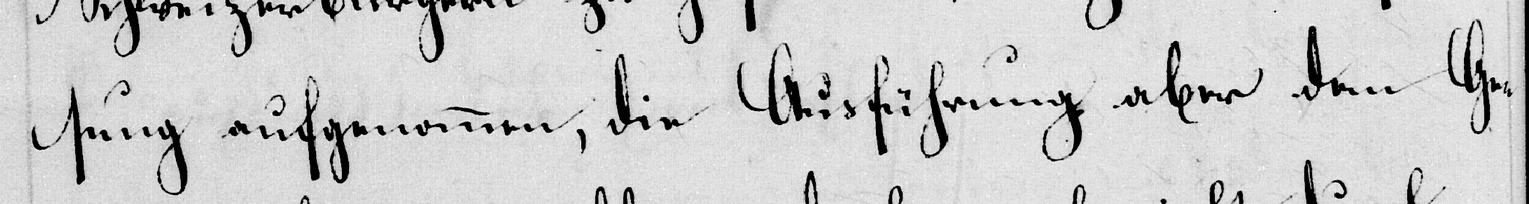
ßung aufgenommen, die Ausführung aber dem Ge¬
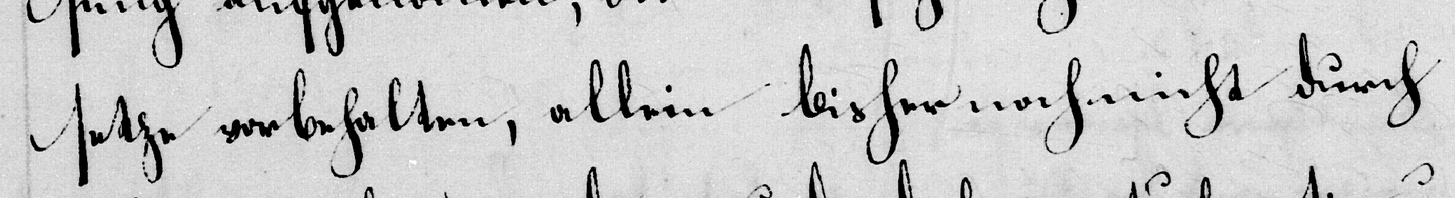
setze vorbehalten, allein bisher noch nicht durch
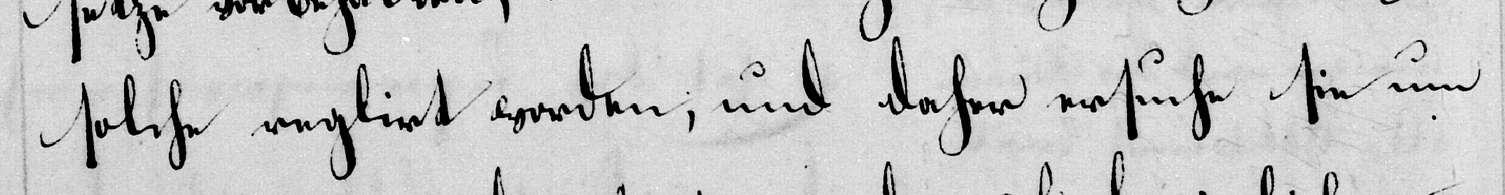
solche reglirt worden, und daher ersuche sie um
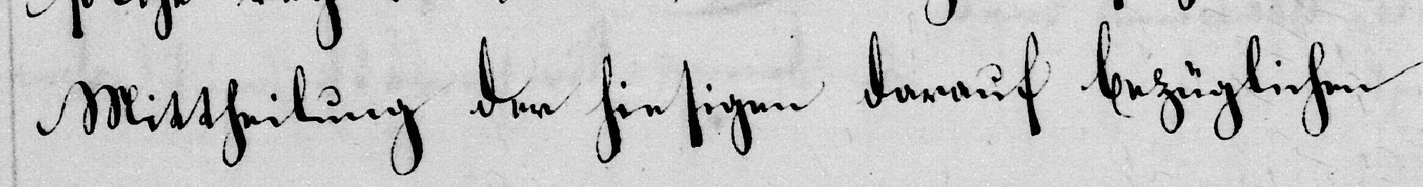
Mittheilung der hiesigen darauf bezüglichen
